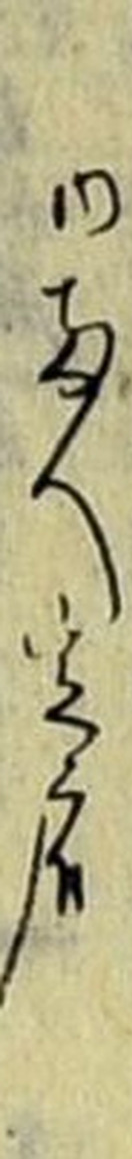内両人定府
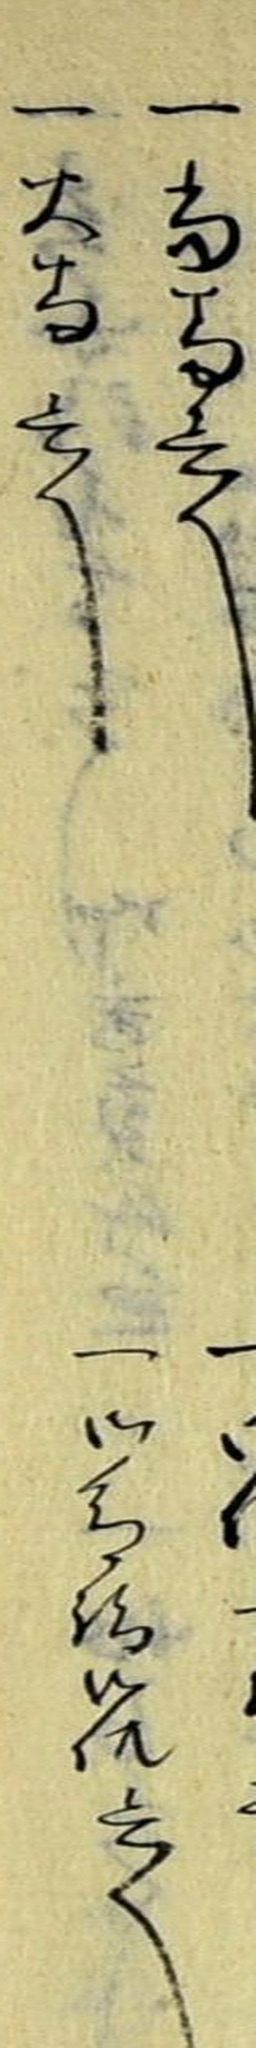一火番壱人一御馬指御供壱人

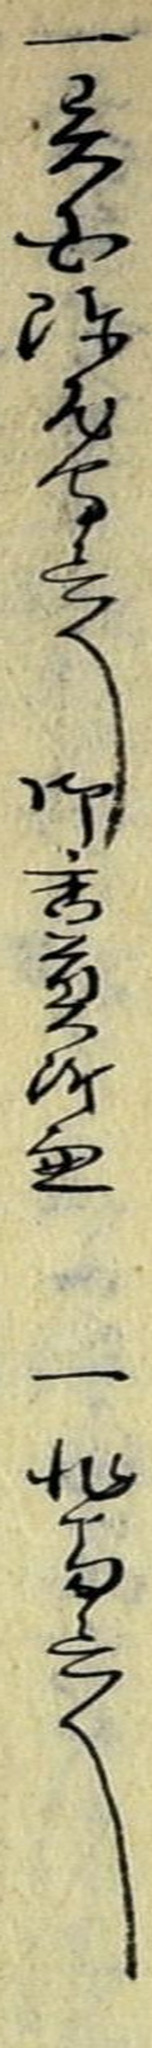一異国陣屋守壱人御香典附兼一非番壱人
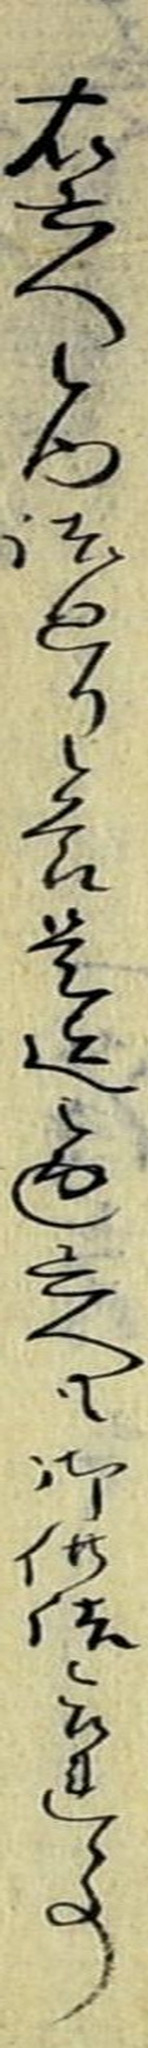右六人之内諸廻り之節是迄之通壱人も御供詰に召連候事
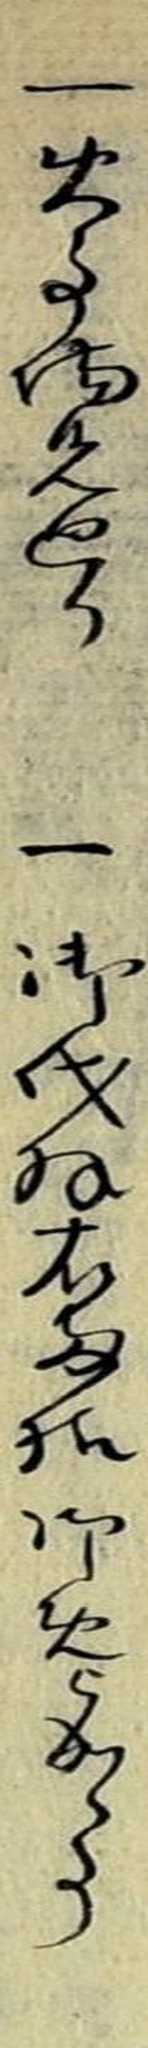一火事場見廻り一御代拝右両様御免被成候事
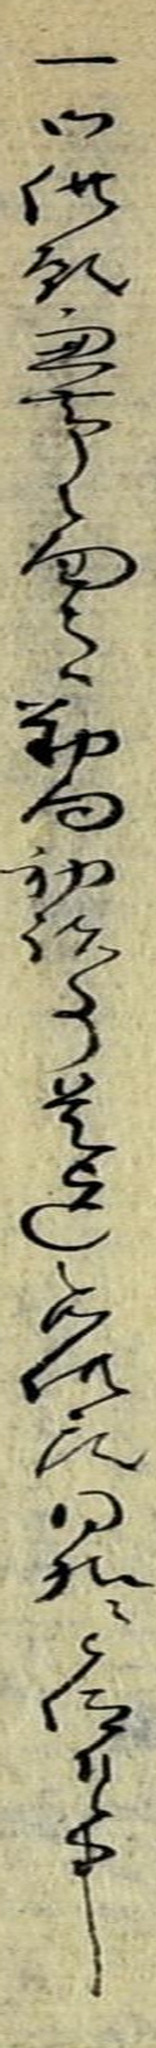一御供頭兼帯之面々は勤向初諸事是迄之御供頭同様に被仰付候事
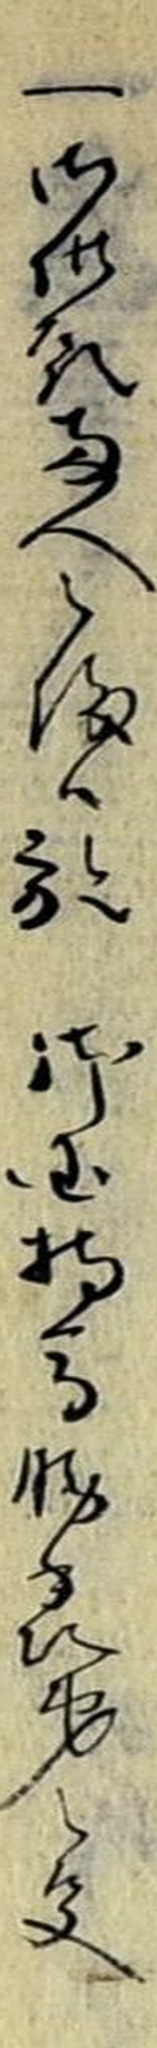一御供頭両人之儀は於御国持馬勝手次第之事
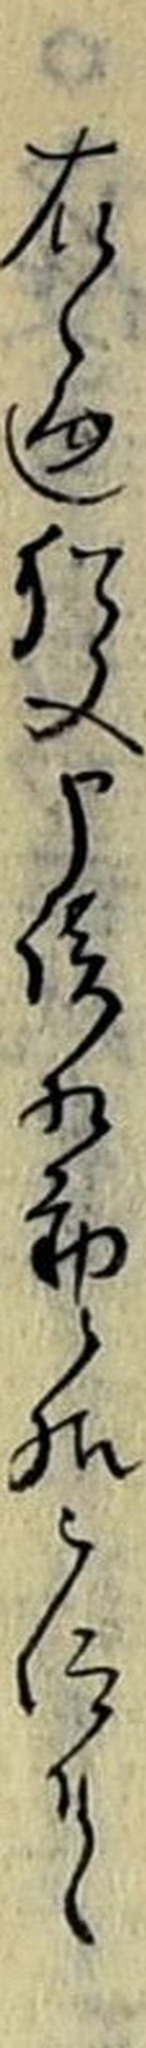右之通猶又申談相勤候様被仰付候
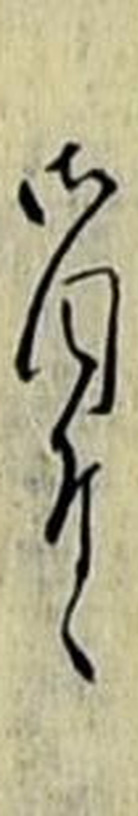御目付へ
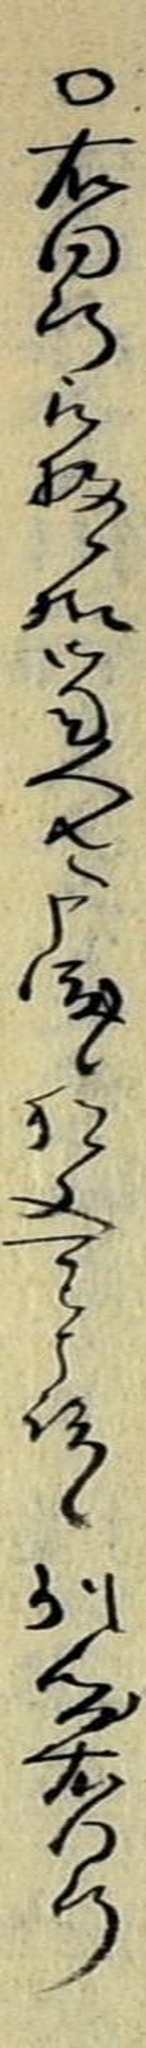○右同断取扱候様御用人共へ申渡候猶又可被申渡候別紙右同断
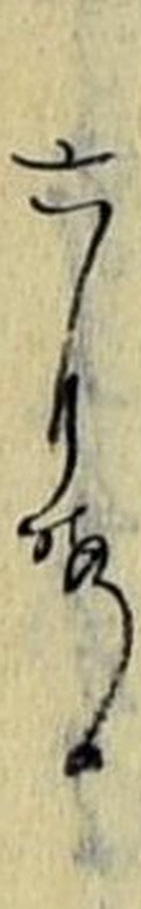六月晦日
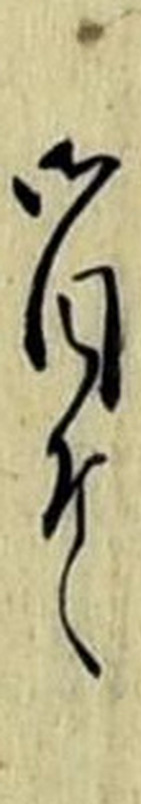御目付へ
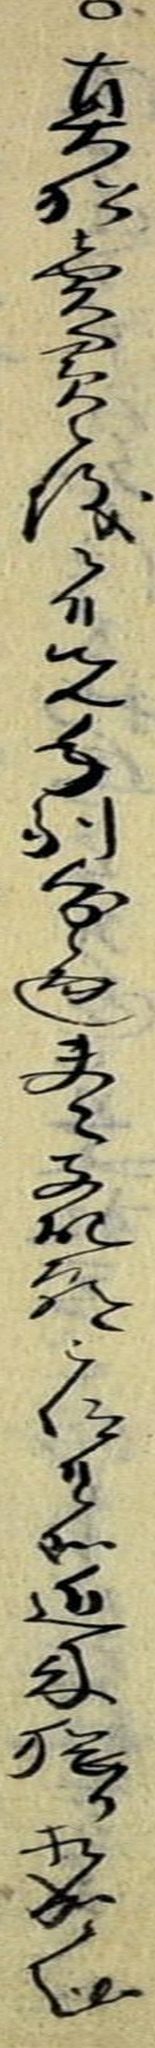○真松売買之儀に付先年別紙之通夫々支配頭へ被仰付候処近来猥り相成候趣
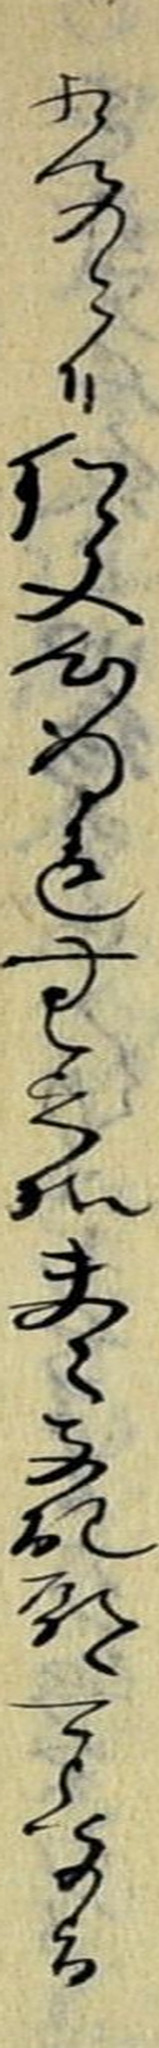相聞候に付猶又心得違無之様夫々支配頭へ可申聞旨
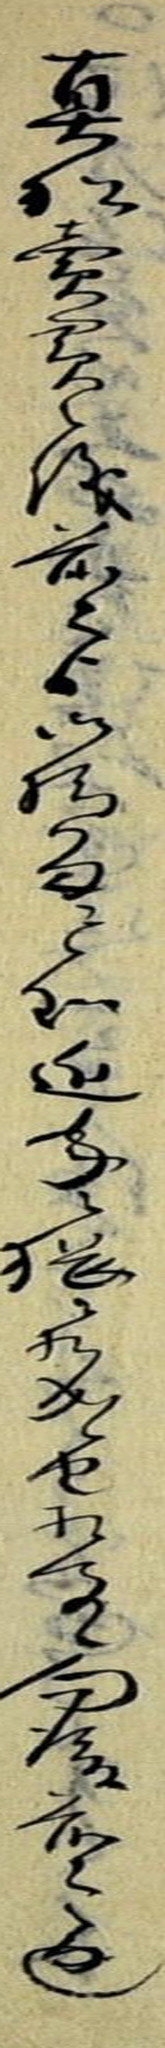真松売買之儀前々ゟ御指留に候処近年猥に相成候由相聞候向後前々之通
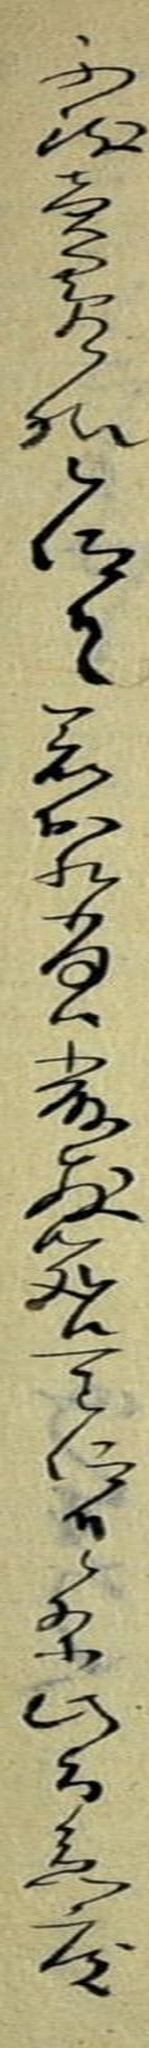不致売買候様被仰付候若於相背は厳敷御咎可被仰付候条此旨急度
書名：命令之部 四
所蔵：福井県文書館 Fukui Prefectural Archives
